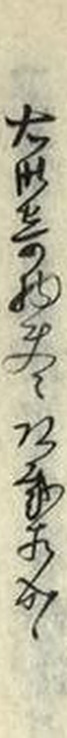右御寄物夫々頂戴相成候
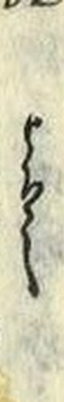被進之

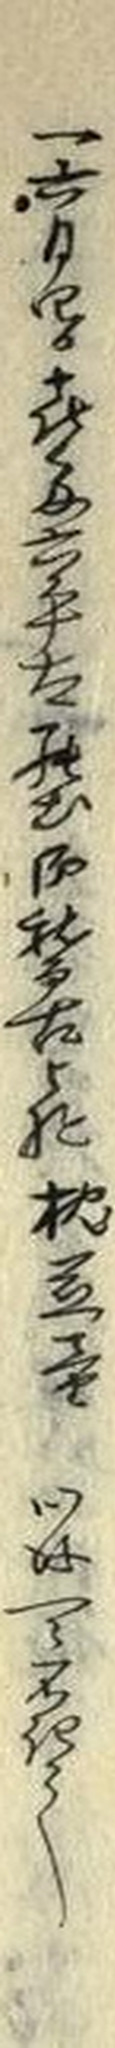一六月四日喜多六平太罷出御稽古被遊枕慈童以後一々不記之
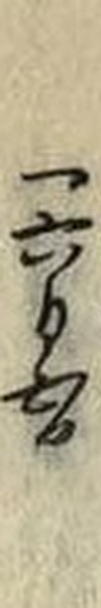一六月八日
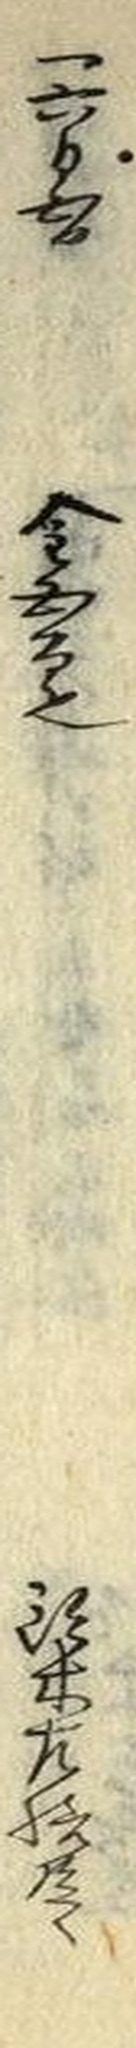一六月五日金五百疋鈴木左膳殿へ
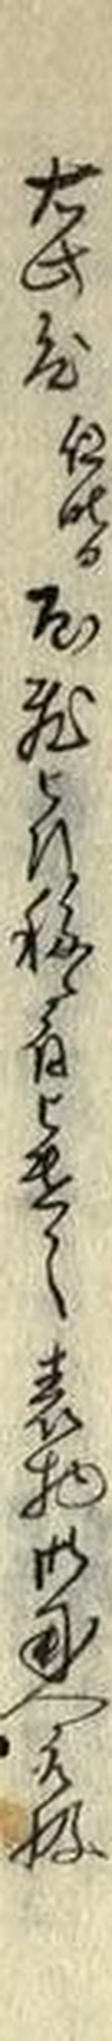右此度但昨日屋敷被引移候ニ付被遣之表物御用人取扱
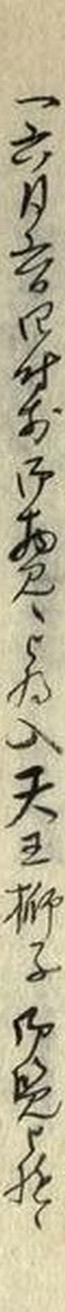一六月六日四時前御物見へ被為入天王獅子御覧被遊候
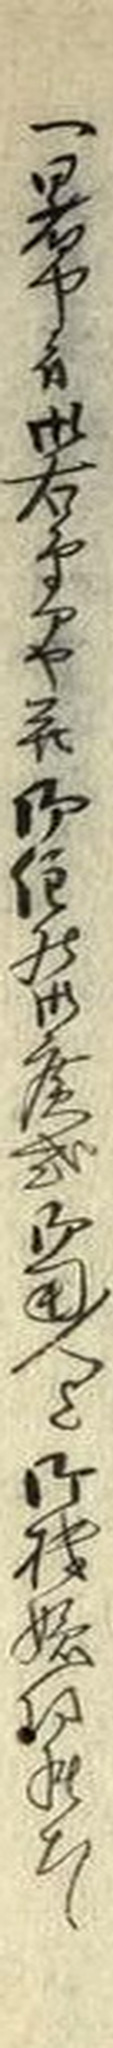一暑中ニ付御右筆部屋幷御住居御広式御用人迄御機嫌伺罷出候
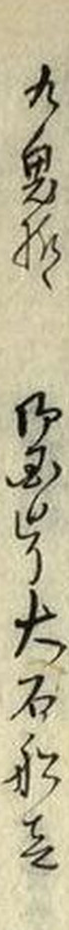九鬼様へ御国廻り大石船壱
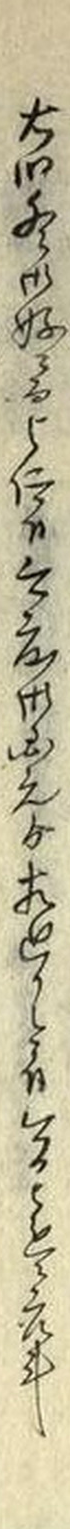右旧冬御好ニ而被仰付今度御国元ゟ相廻り候ニ付今日被進ニ取計
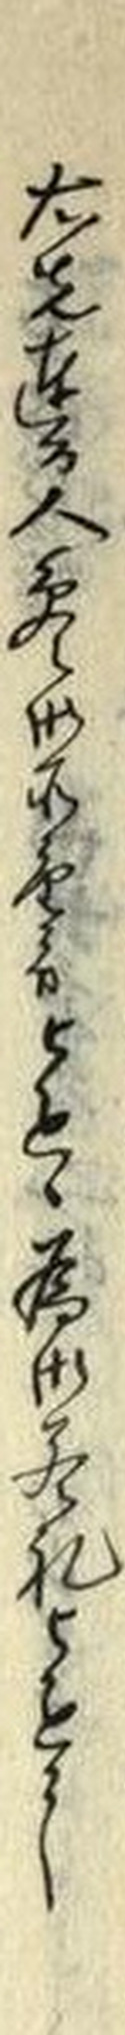右先達而人受之御所望ニ付被進候為御答礼被進之
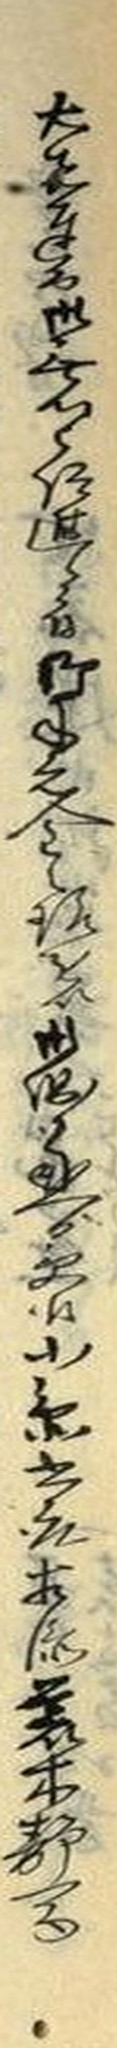右先達而御無心被仰進候ニ付御手元金之趣を以御側御用人ゟ受取小兵衛書取相済荒木静馬
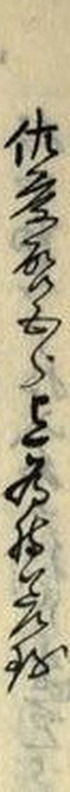佐藤啓五郎迄為持差越
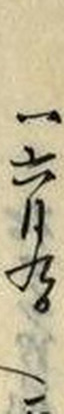一六月八日
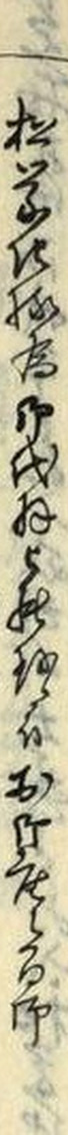松栄院様為御代拝被罷越候ニ付御御座之間御
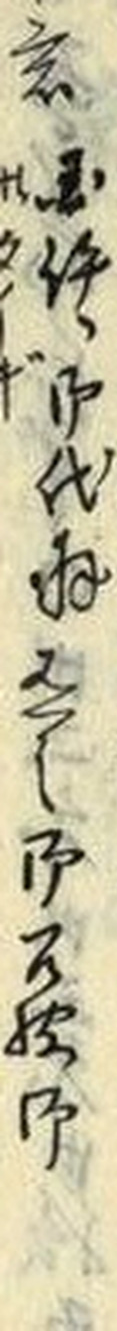御タイギ有之御召服御
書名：少傅日録抄（斉善付側向頭取日記、在府）
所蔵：福井県文書館 Fukui Prefectural Archives
